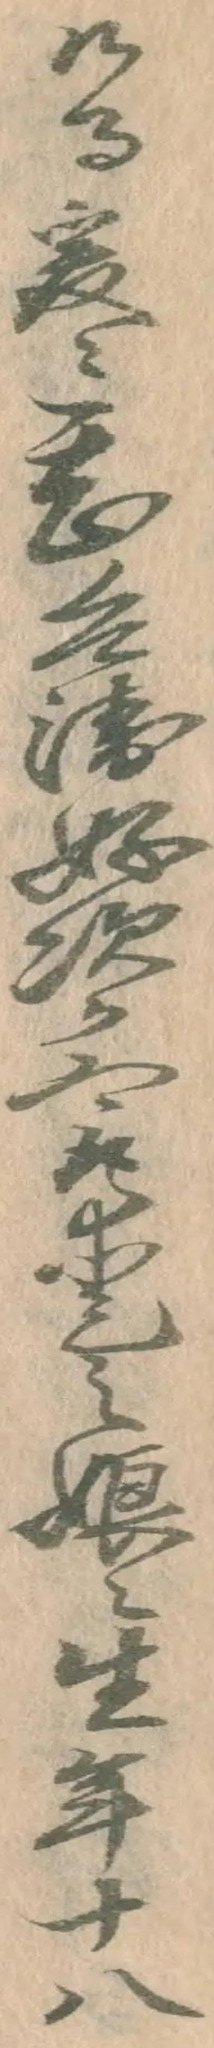ける爰に甚兵衛好次か最愛之娘に生年十八
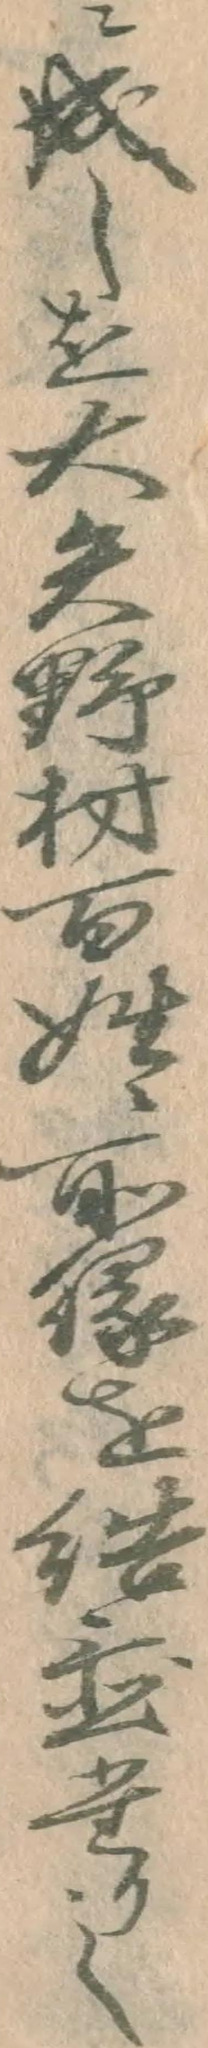に成しを大矢野村百姓所縁を結置堂りし
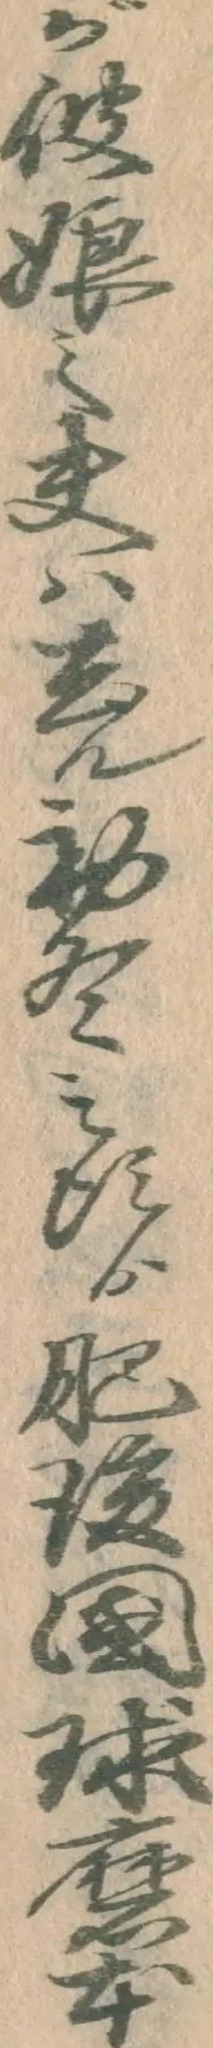が彼娘之夫は去る初冬之頃ゟ肥後国球磨本
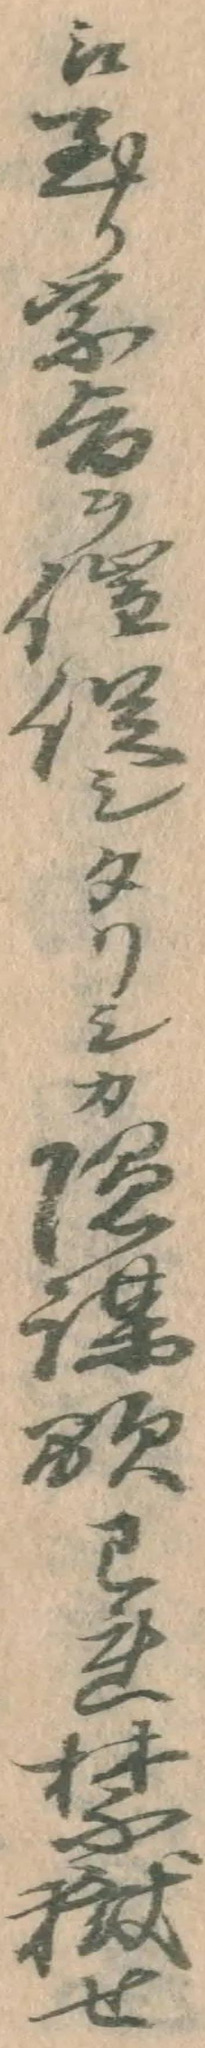江至り宗旨を催促したりしか隠謀顕已連禁獄せ
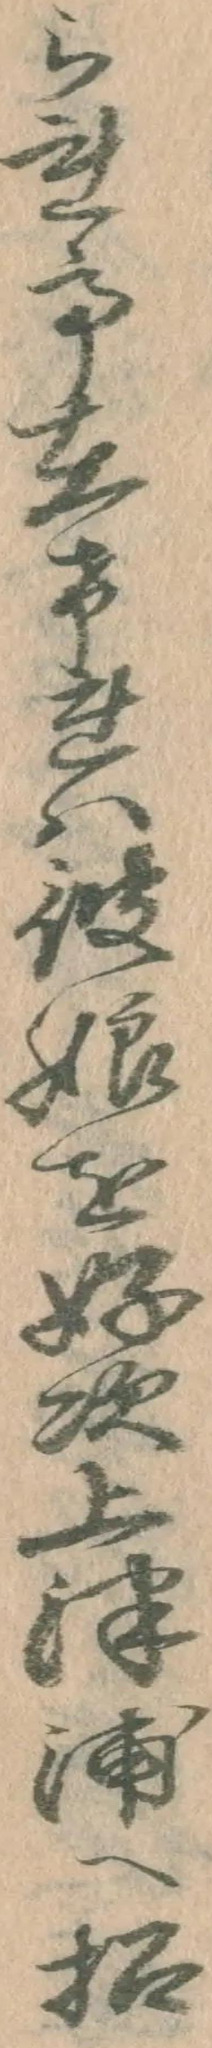ら連亭在希連は彼娘を好次上津浦へ招
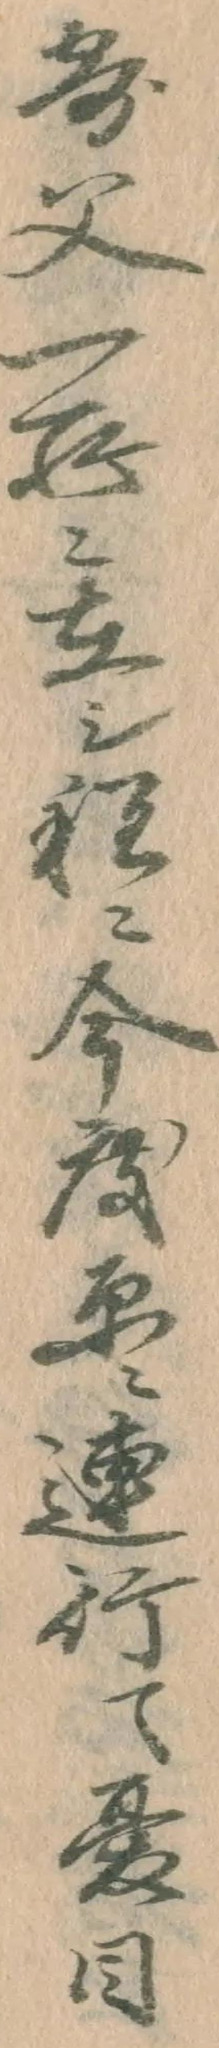寄父一所に在し程に今度原に連行て憂目
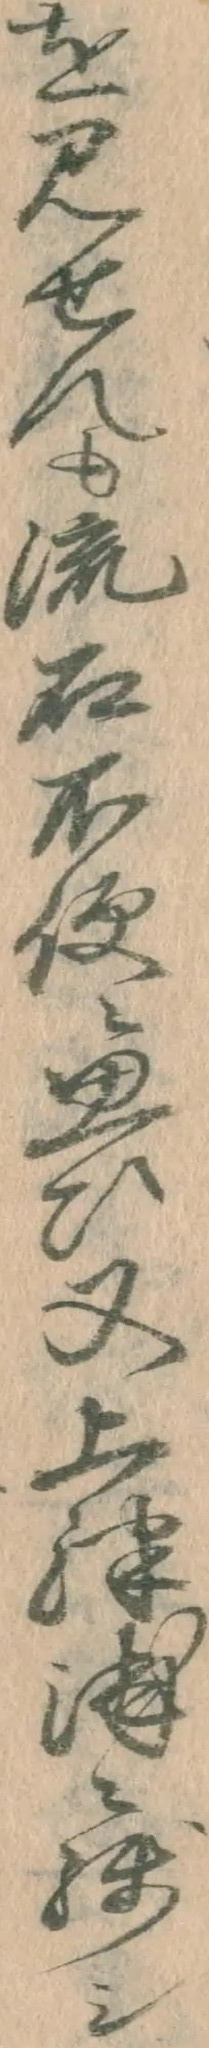を見せんも流石不便に思ひ又上津浦に残し
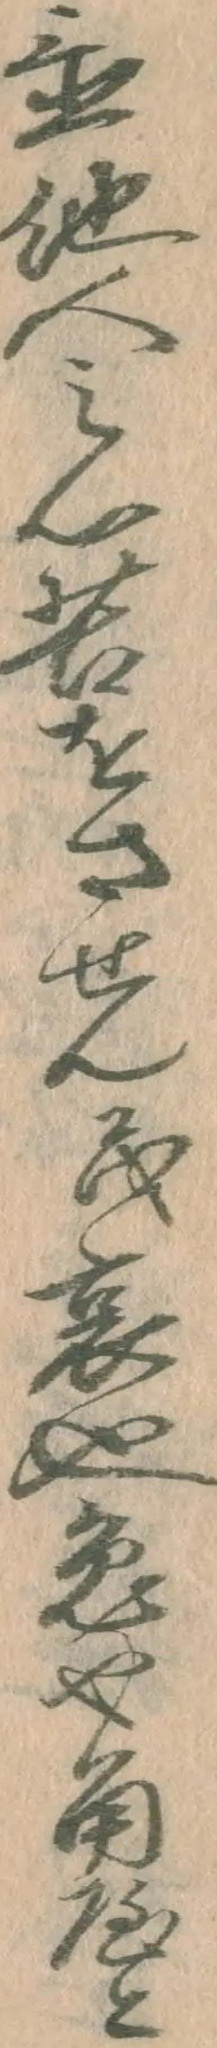置他人之心苦をさせん茂哀也兎や角屋と
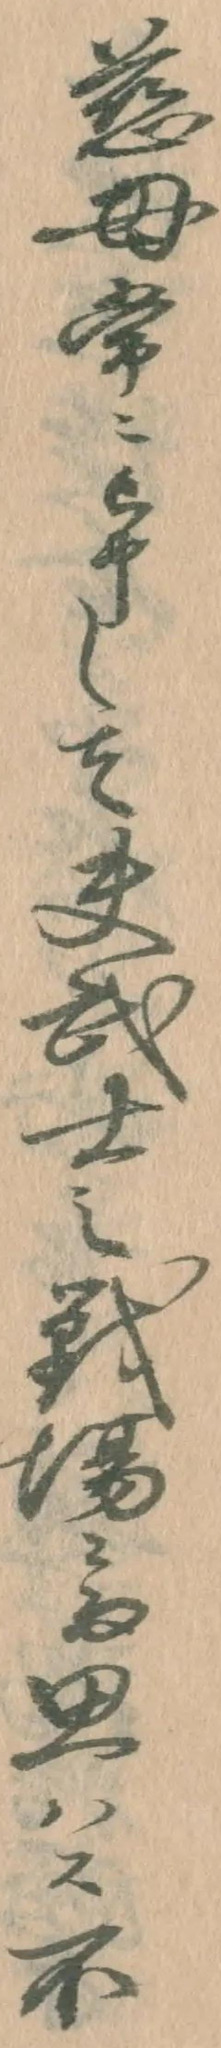慈母常に被申して夫武士之戦場に而思はす不
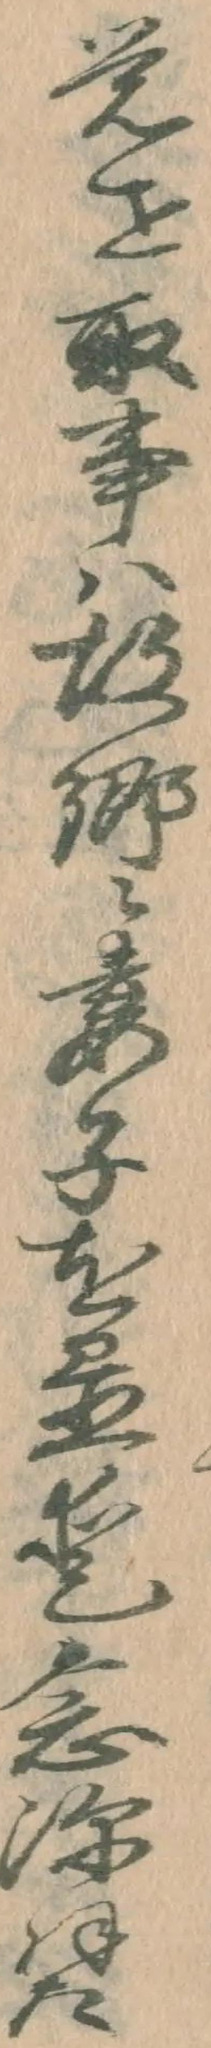覚を取事は故郷に妻子を置愛念深ほた
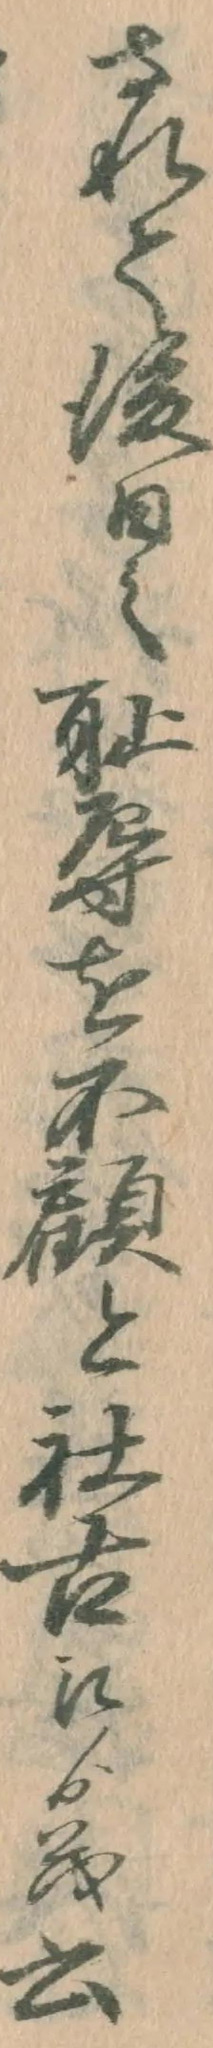されて後日之恥辱を不顧と社古江ゟ茂云
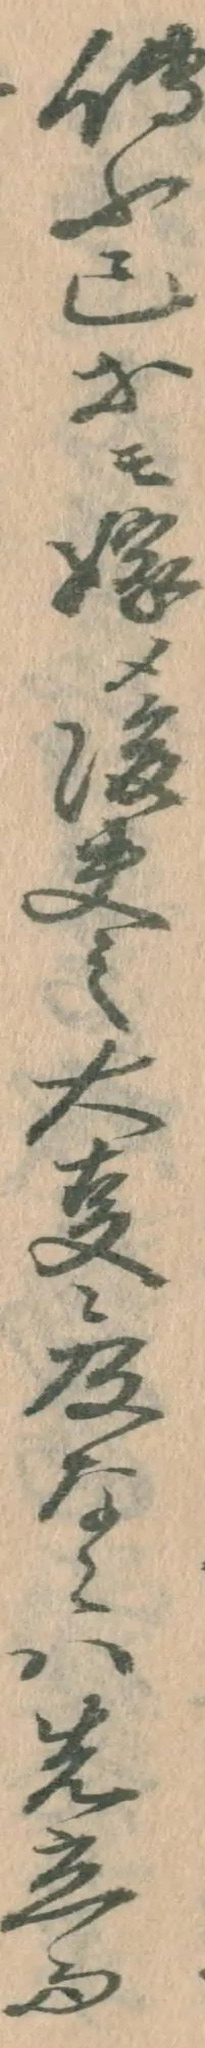伝ふ已等も嫁め後夫之大事に及なとは先立而
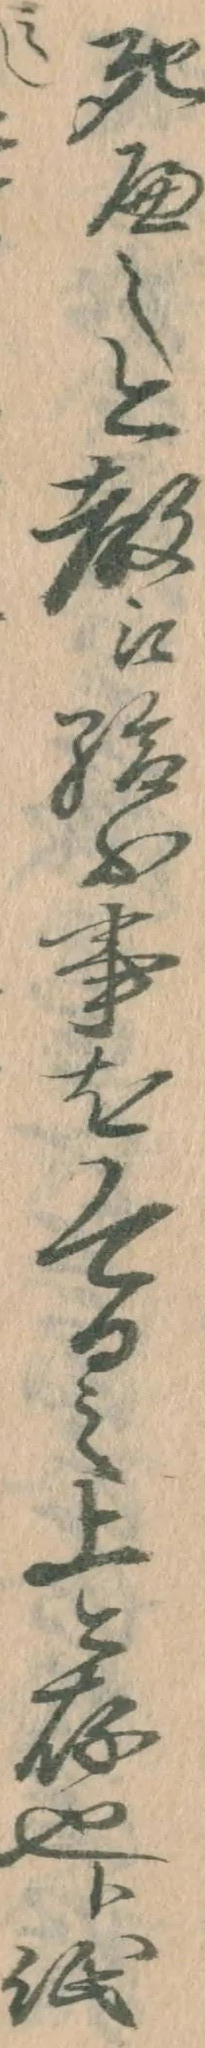死扁しと教江給ふ事を今日之上と存也と紙
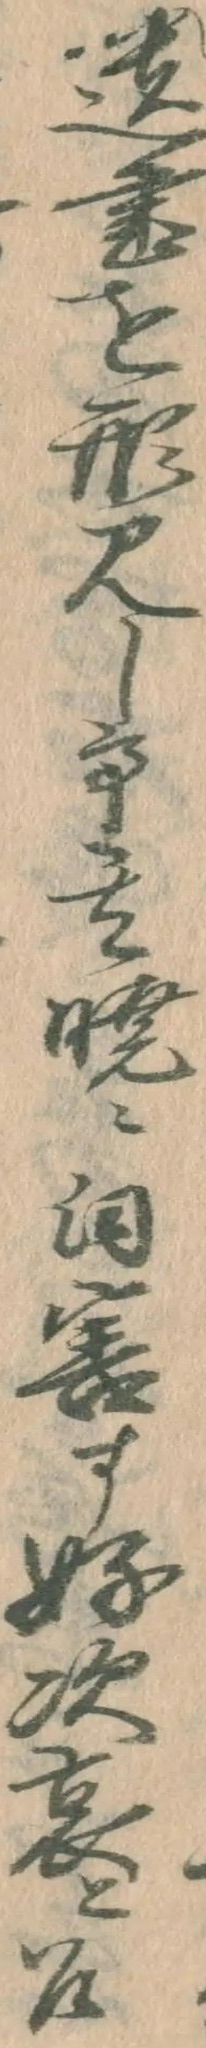之遺書を形見し亭其暁に自害す好次哀と乍
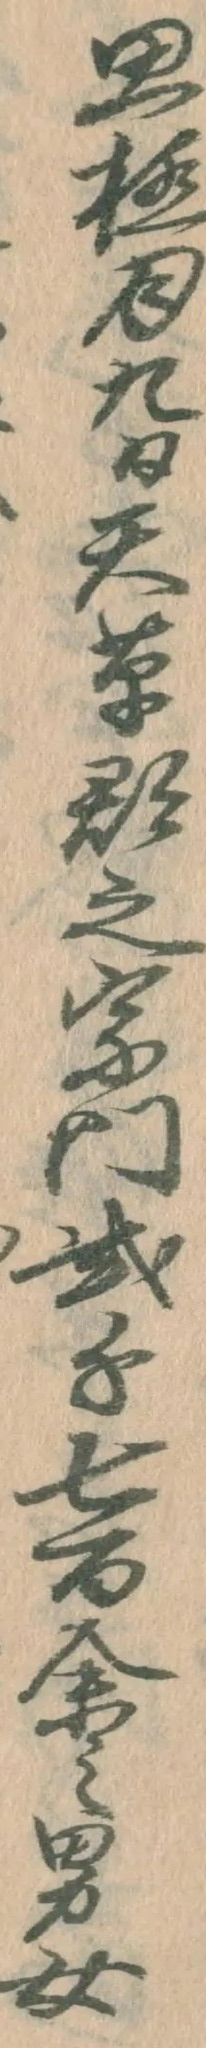思極月九日天草郡之宗門弐千七百余之男女
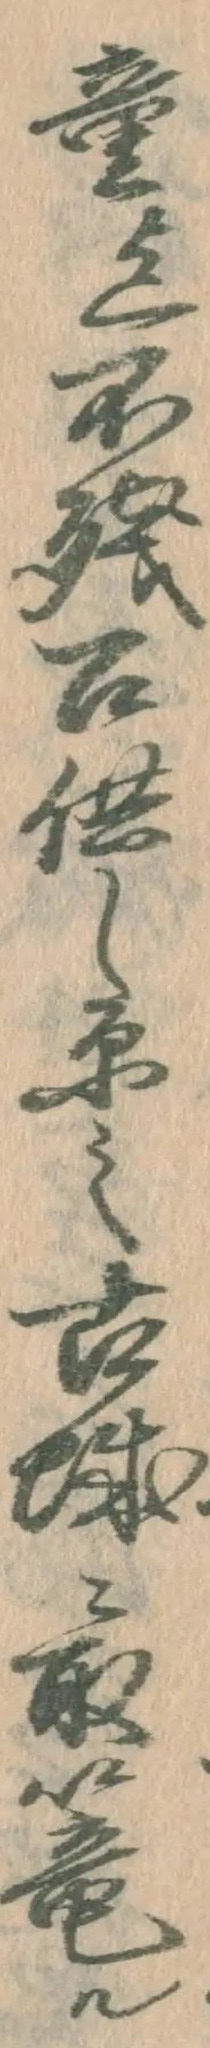童迄不残召供し原之古城に取篭る
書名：切支丹御退治記 49巻. [4]
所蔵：国立国会図書館 National Diet Library, JAPAN
